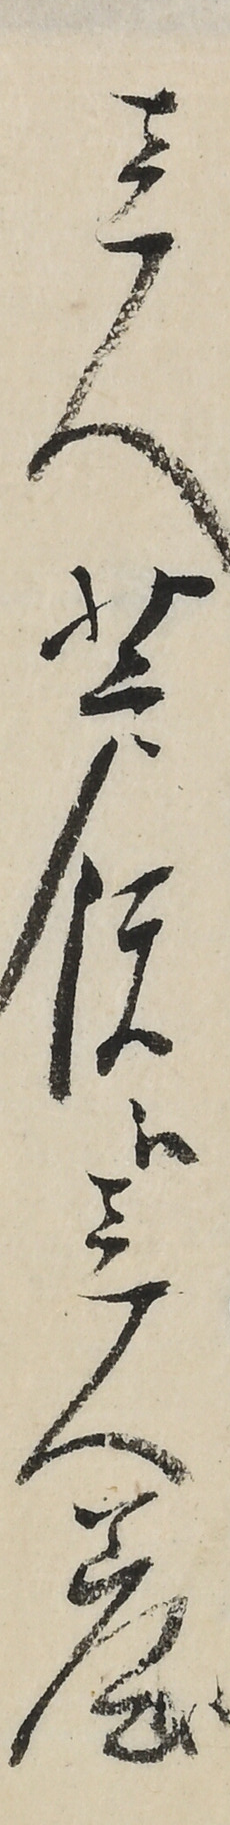壱人芦沢江壱人差出
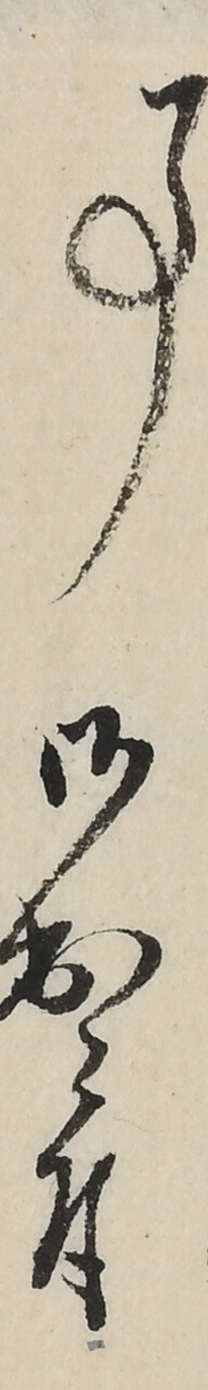事御出ニ付
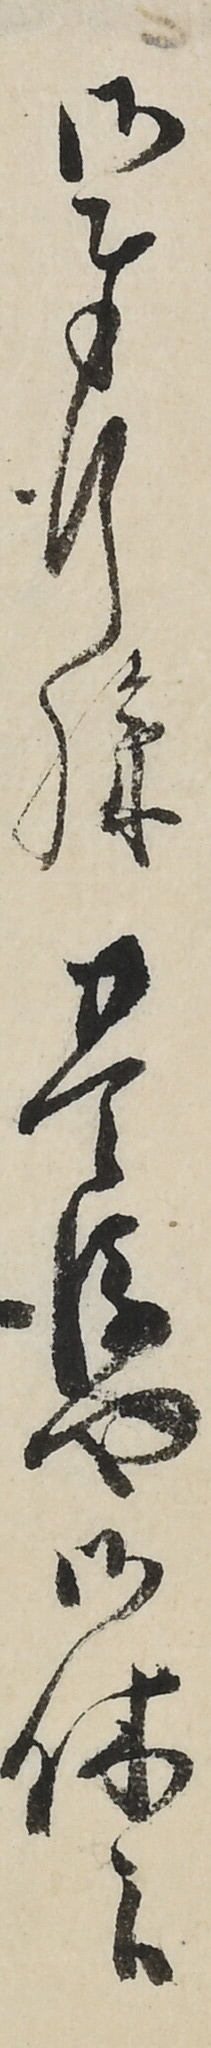御奉行様豊後や御休江
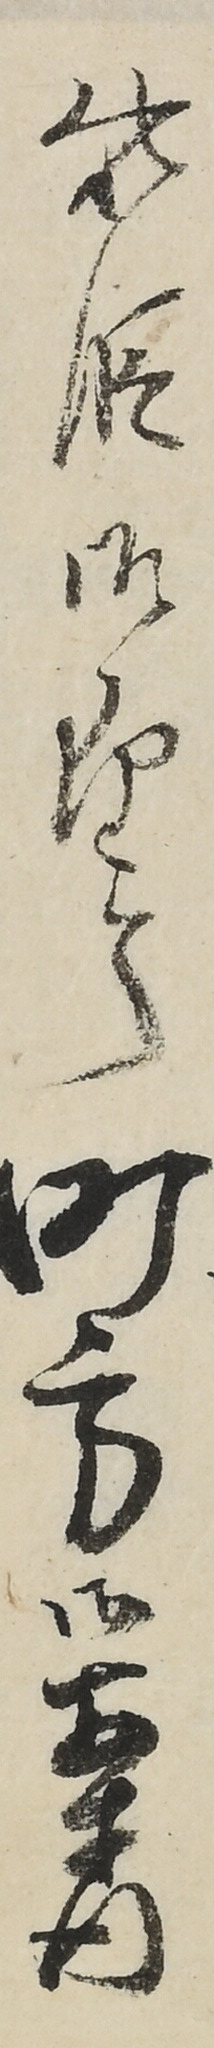此段御望之町方御案内
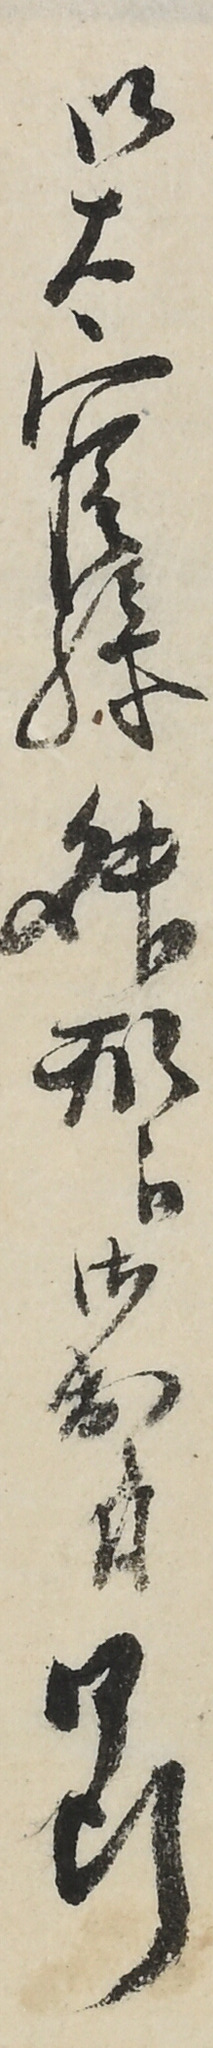御大官様舛形江御出ニ付同断

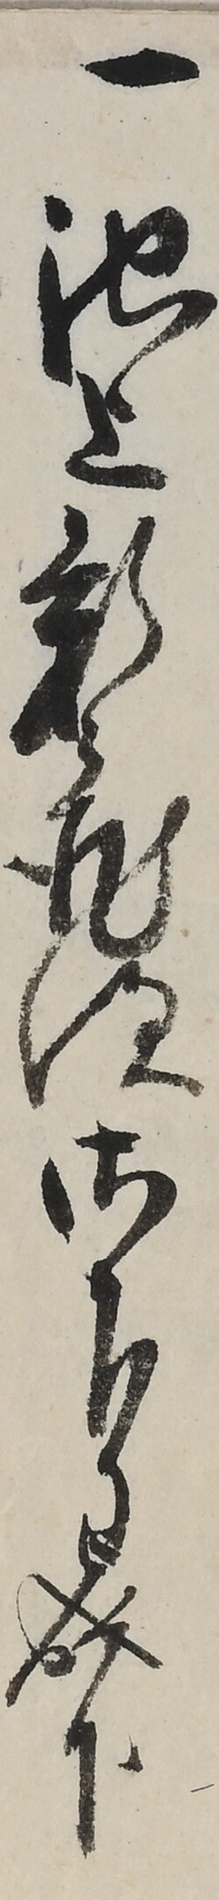一池上新蔵様御下り被成下
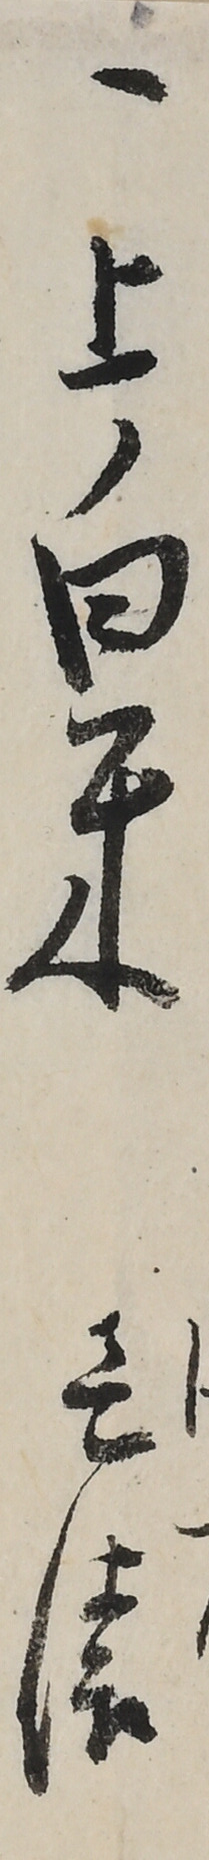一上白米壱俵
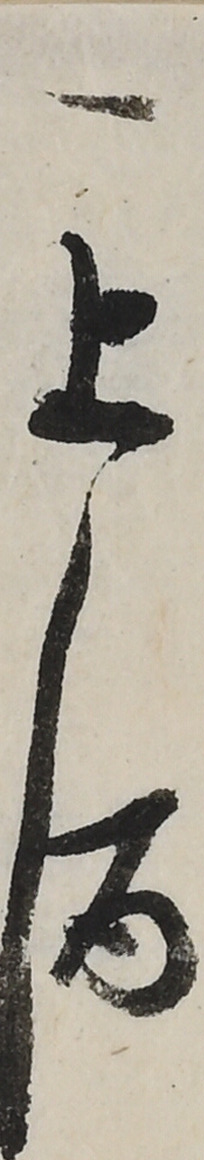一上酒
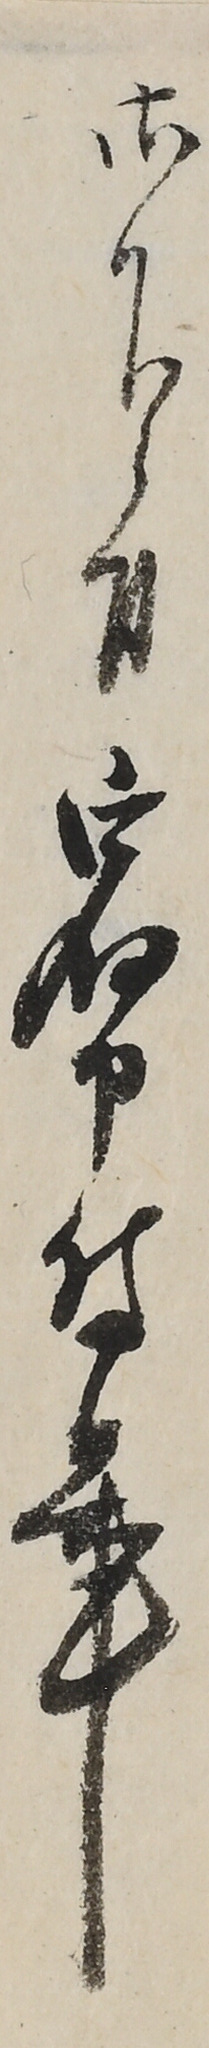御下候付宿申付候事
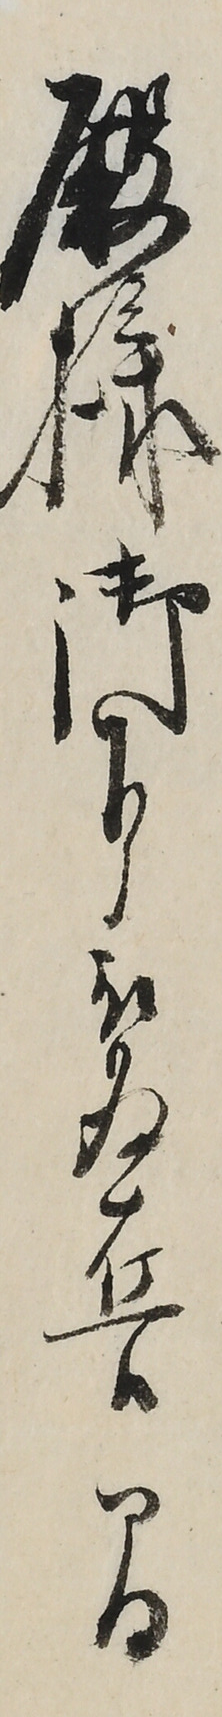殿様御下り被為在候間
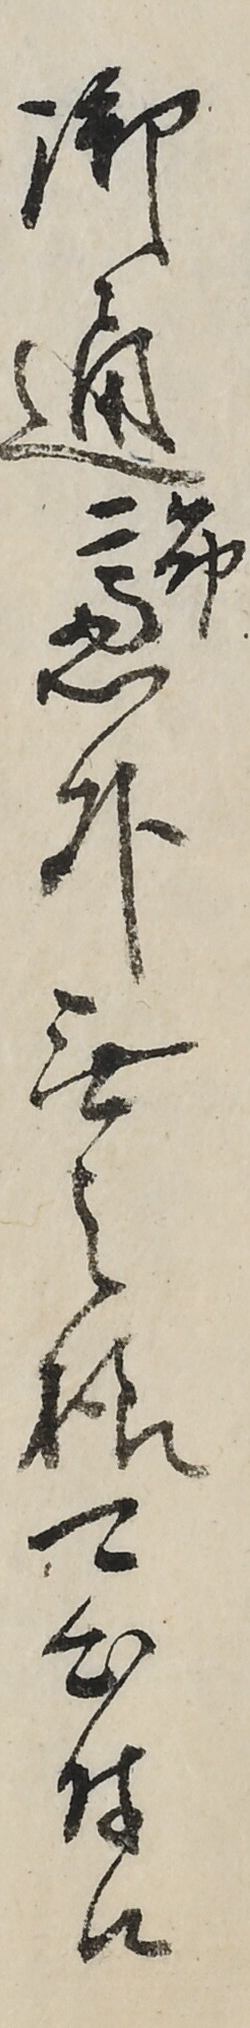御通筋慮外無之様可心付候
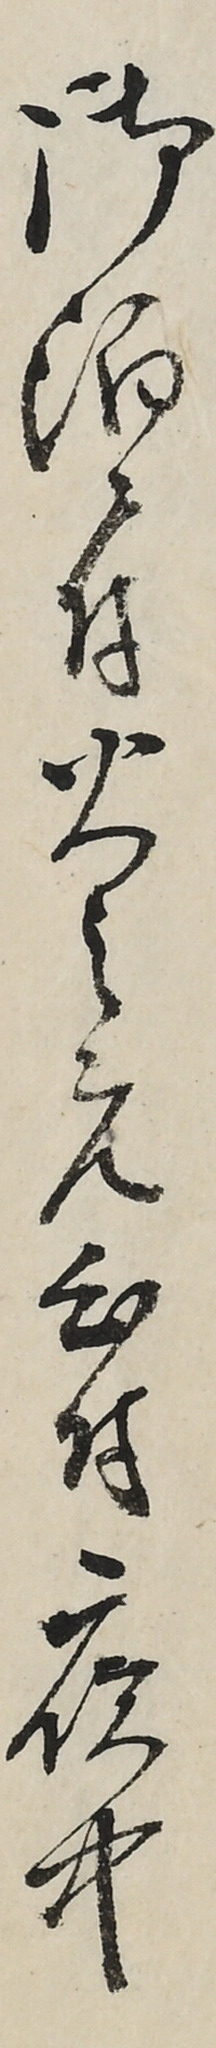御泊ニ付火之元心付夜中
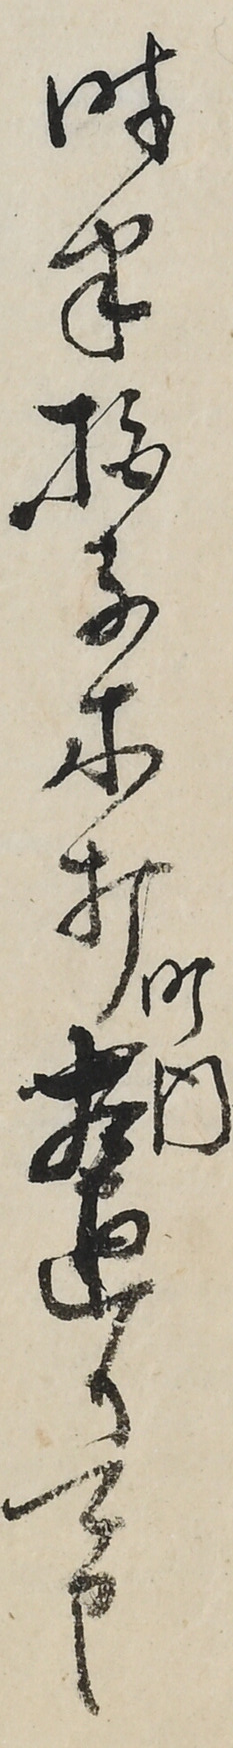時半拍子木打町内相廻り可申
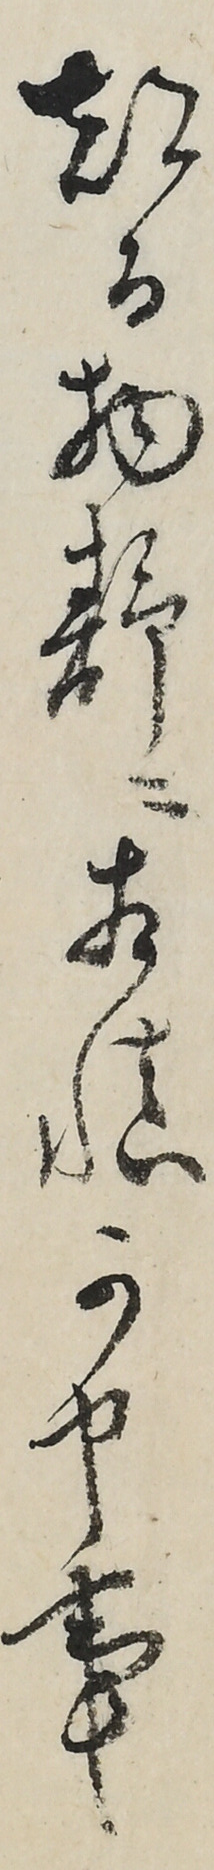起而物静ニ相慎可申事

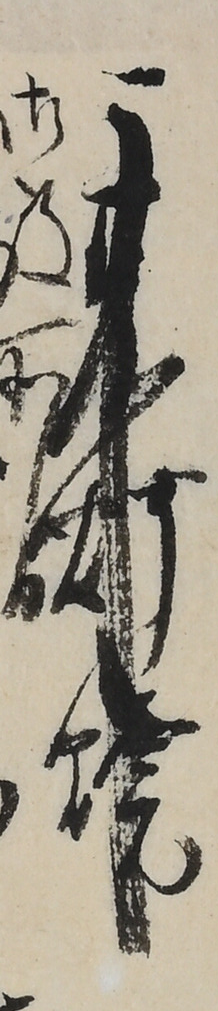御役所ゟ
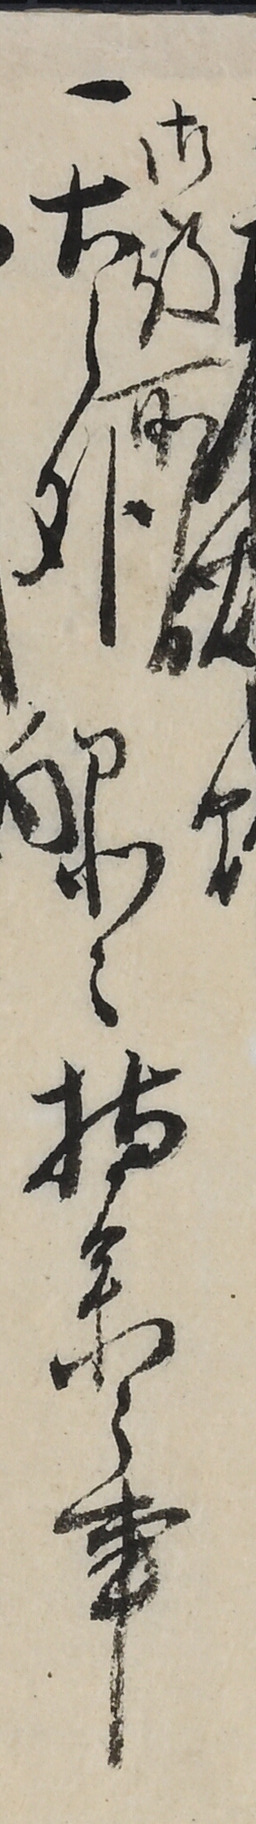一右之外品々持参之事
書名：御巡察様御泊御入用書上帳
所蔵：伊那市立高遠町図書館・合同会社AMANE
